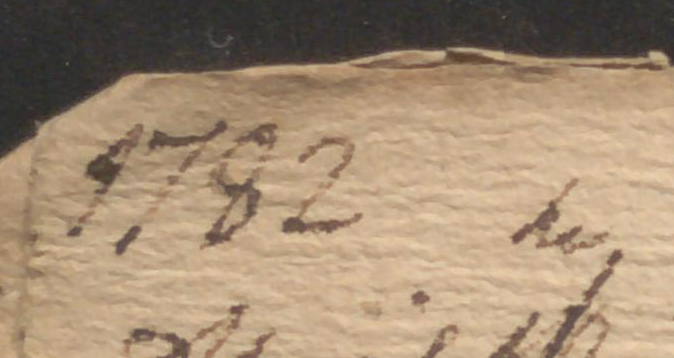1782
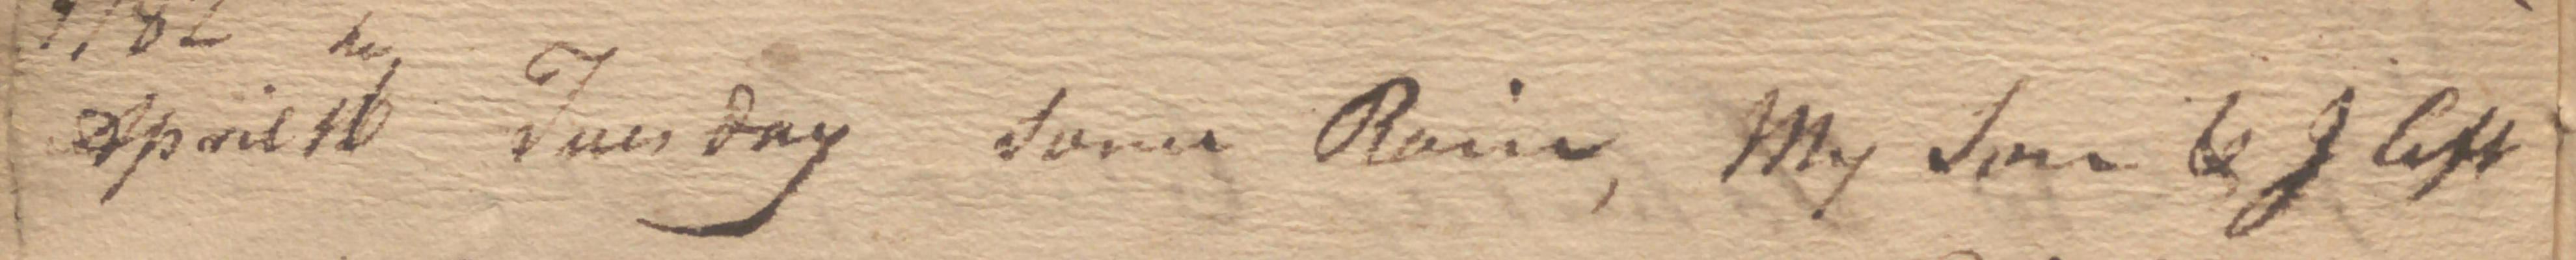April 16^th Tuesday some Rain, My Son & I left
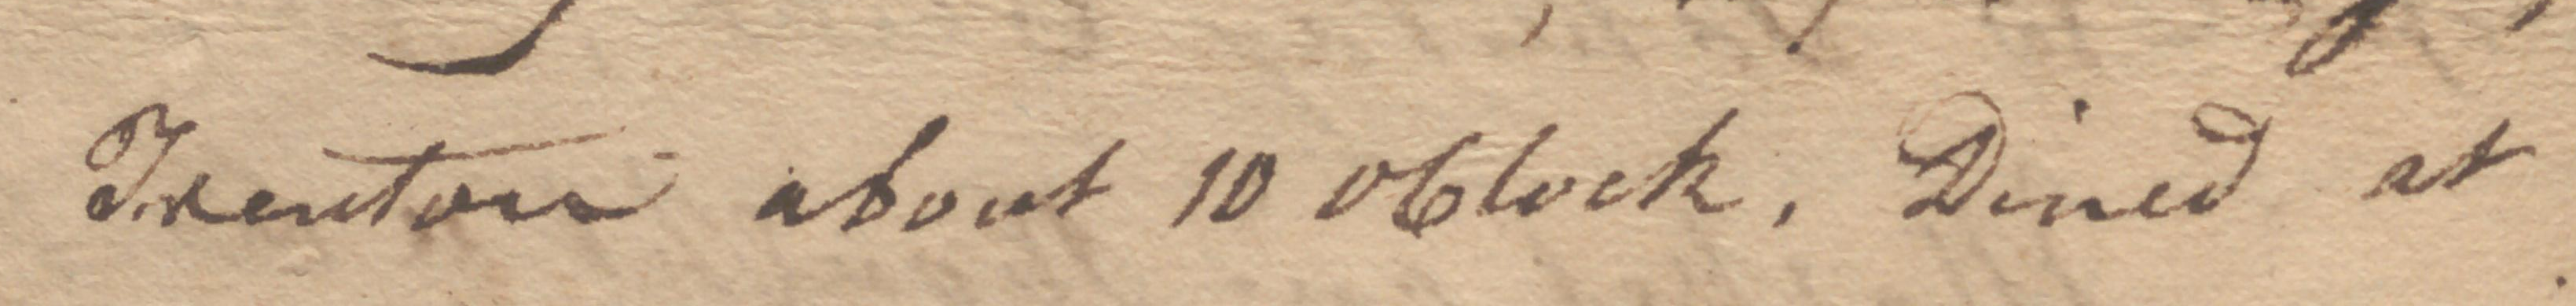Trenton about 10 oClock. Dined at
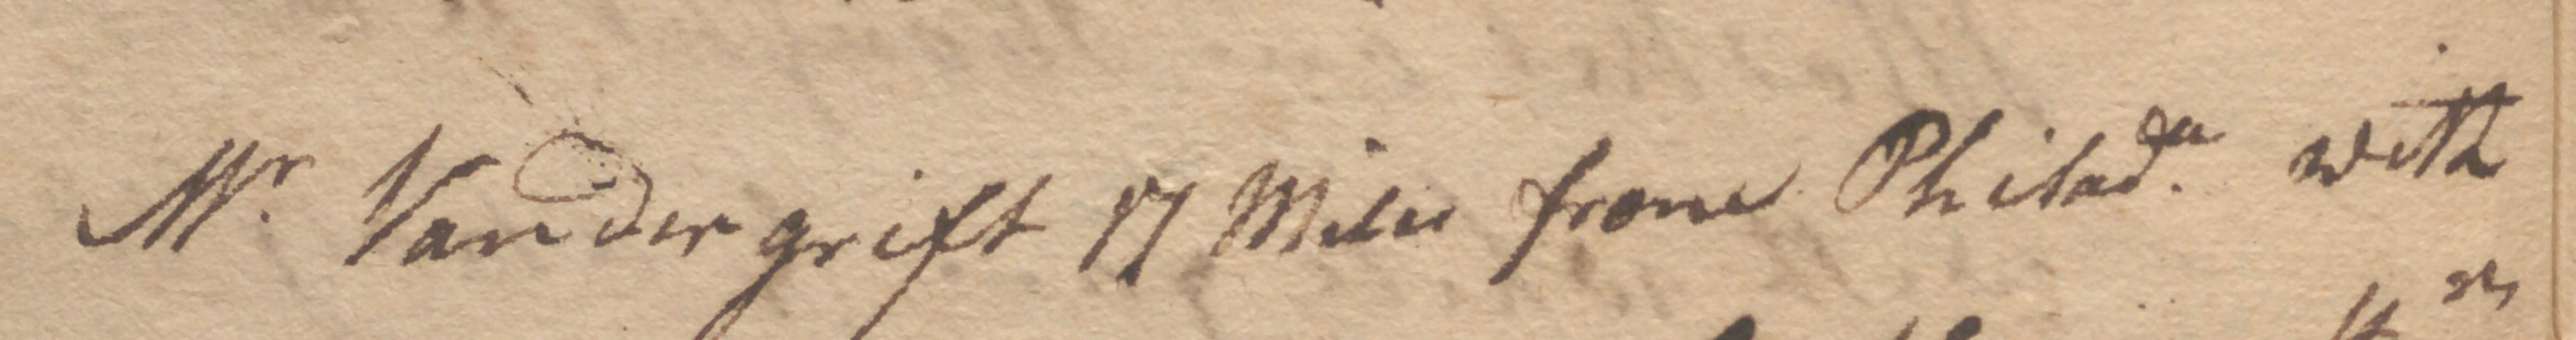M^r. Vandergrift 17 Miles fron Philad^a. with
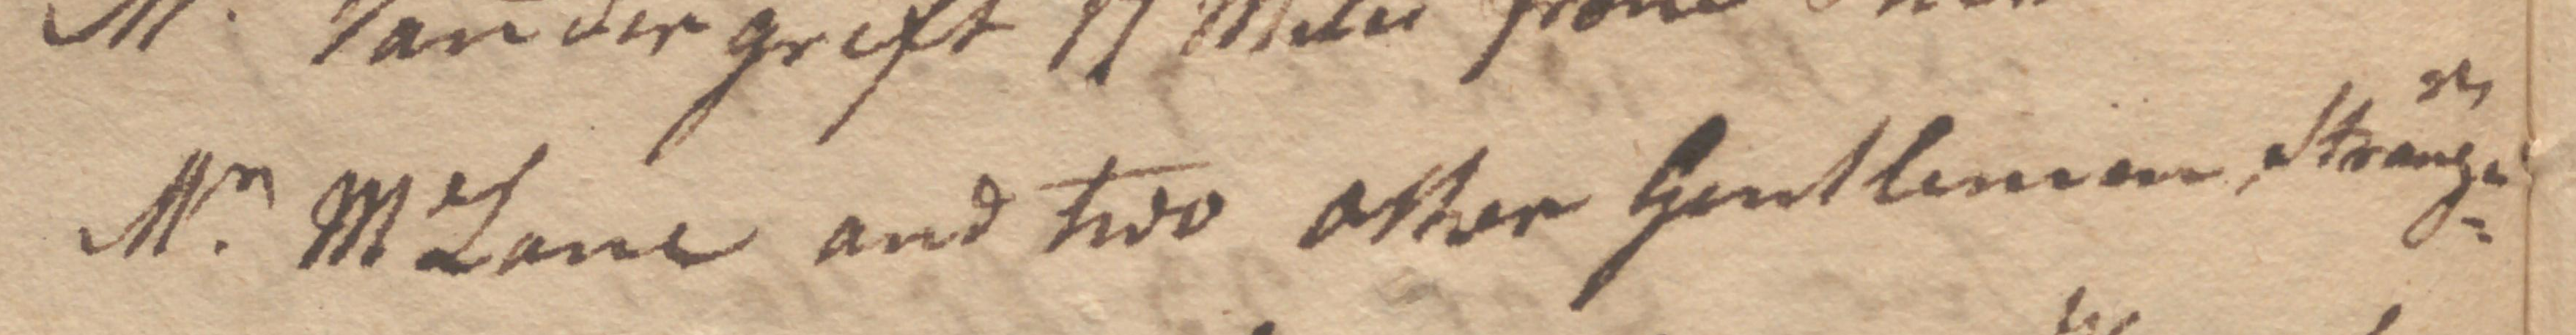M^r. M^cLane and two other Gentlemen Strange^rs
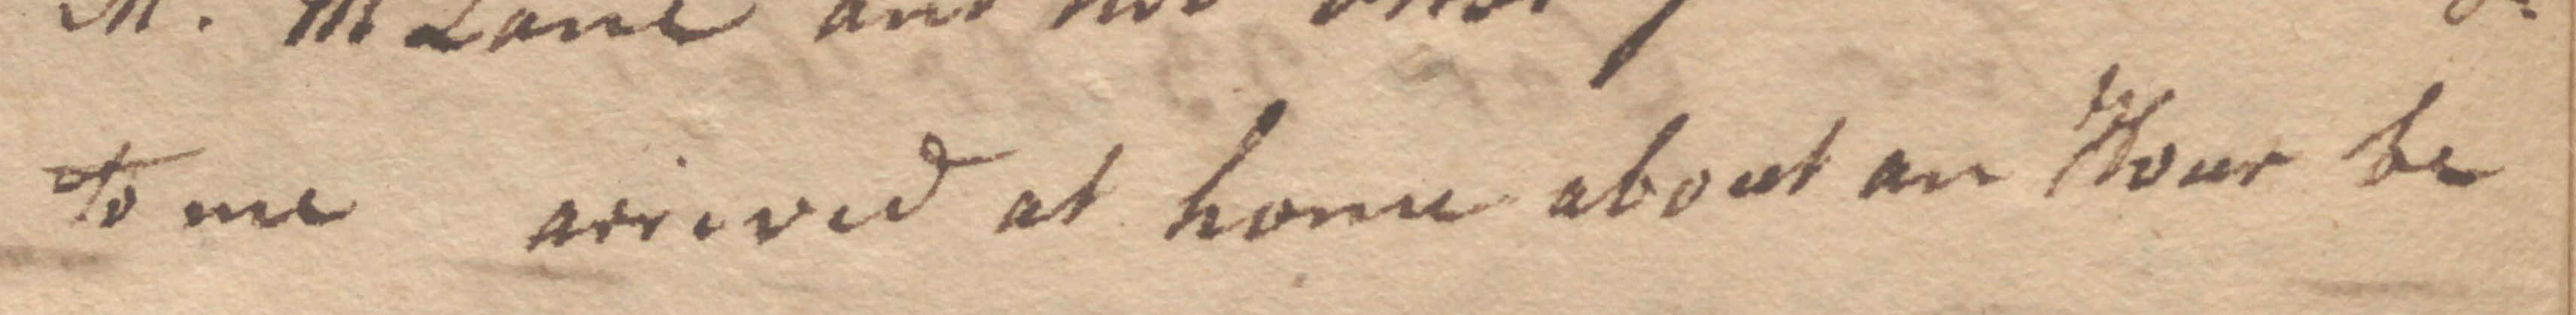to me arrived at home about an Hour be
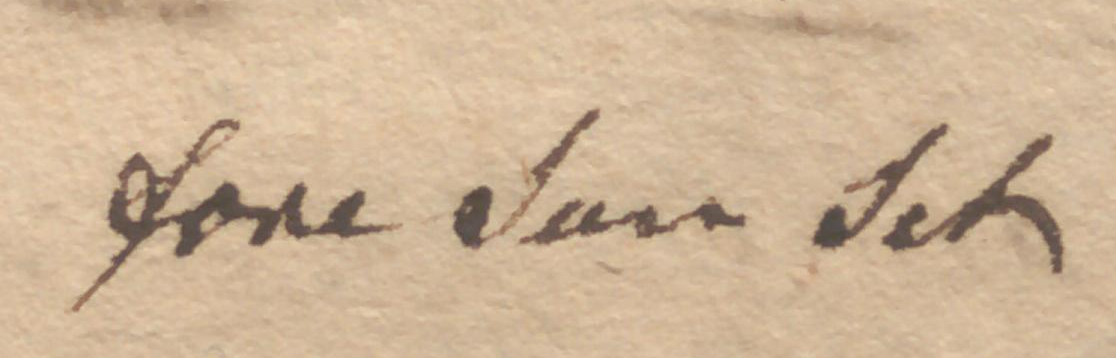fore Sun set
